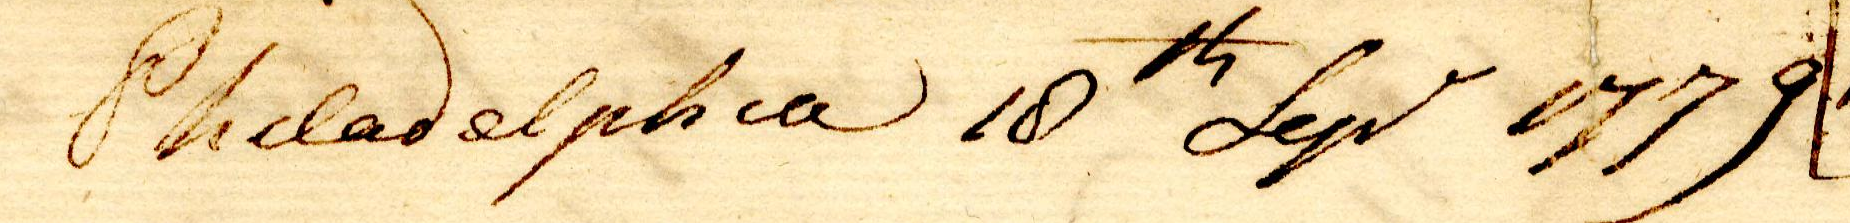Philadelphia 10^th. Sep^r 1779
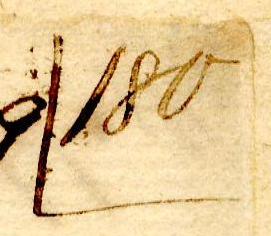180
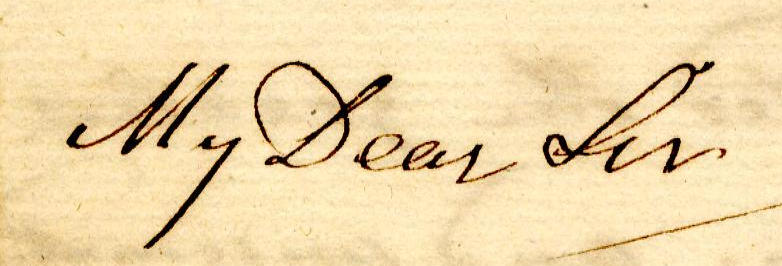My Dear Sir
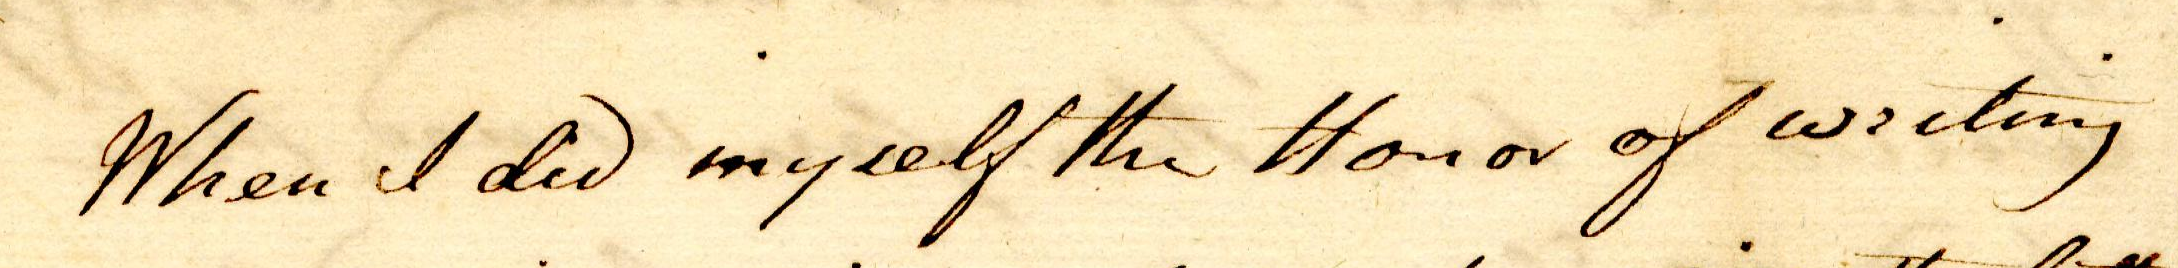When I did myself the Honor of writing
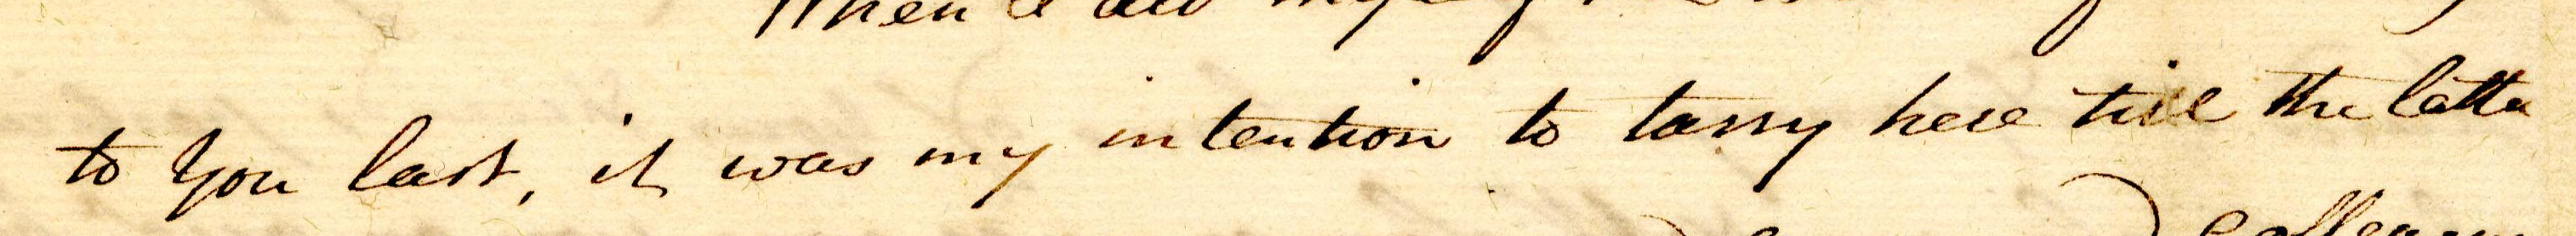to You last it was my intention to tarry here till the late
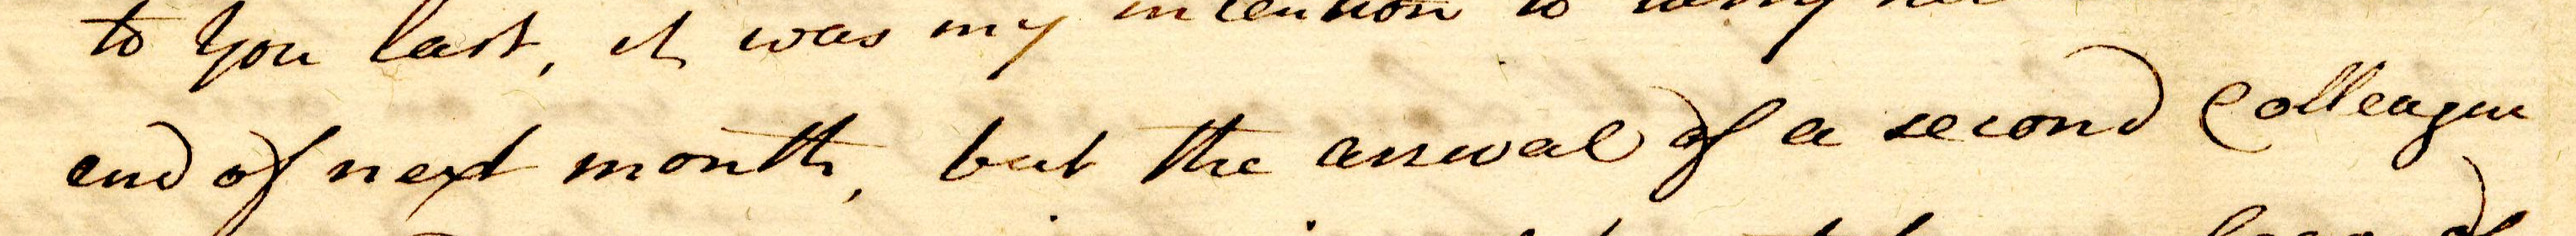end of next month but the arrival of a second Colleague
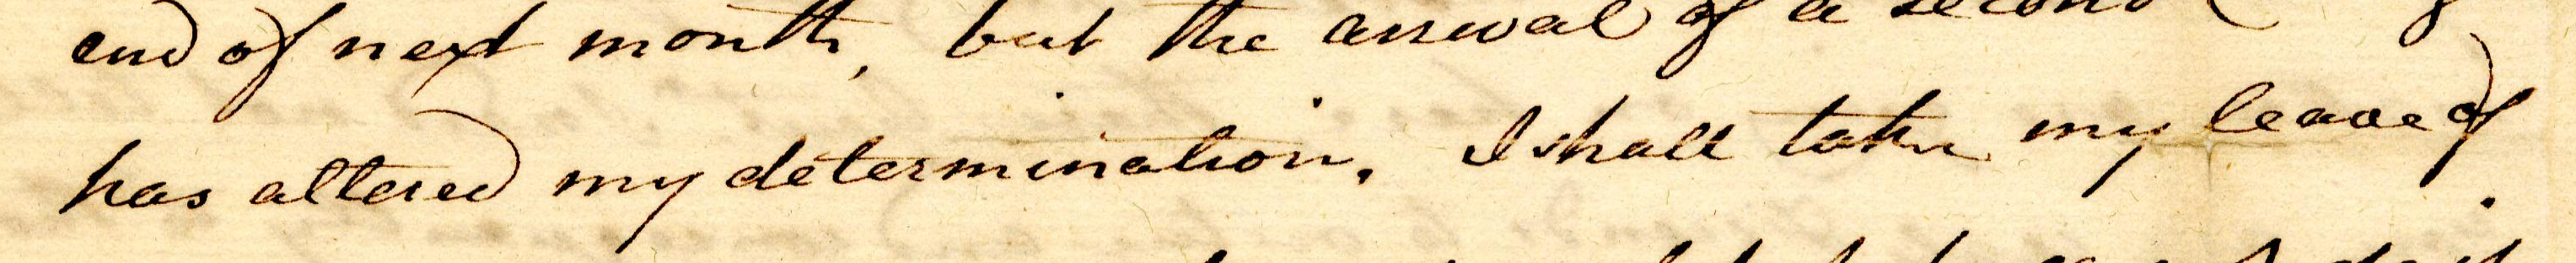has altered my determination, I shall take my leave of
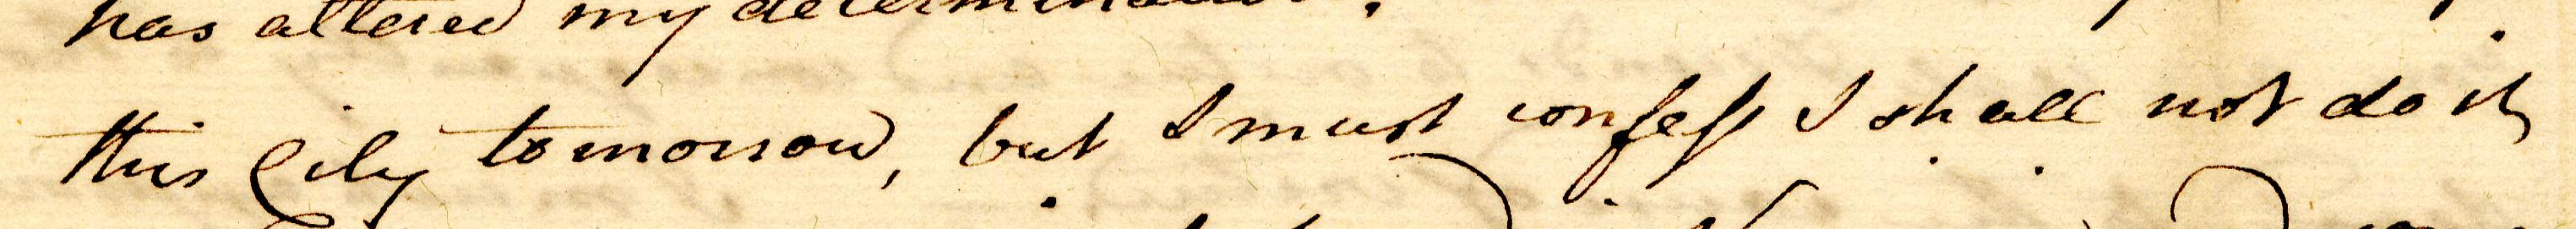this City tomorrow, but I must confess I shall not do it
